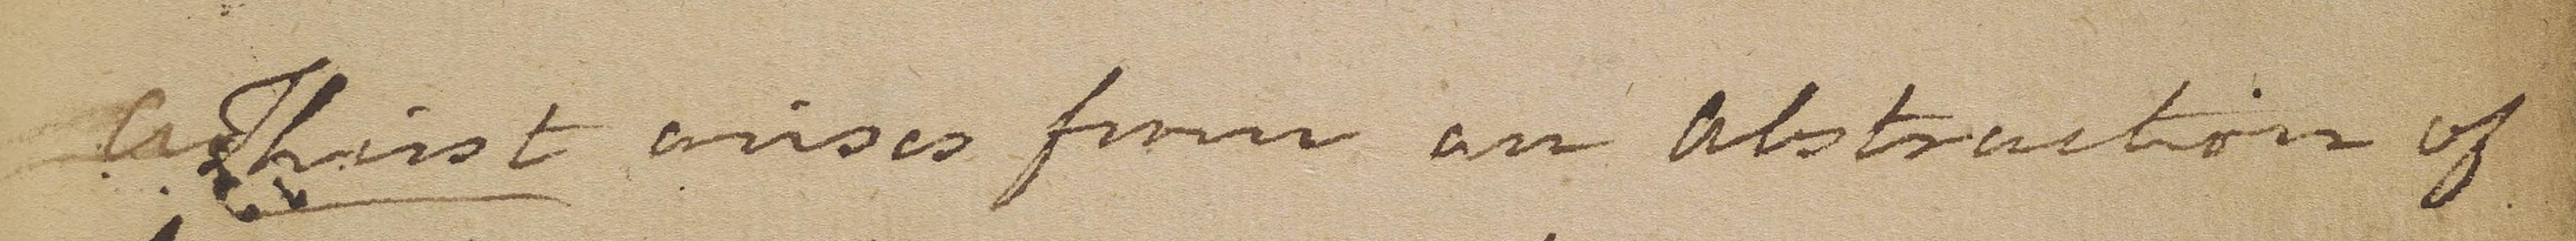Thirst arises from an abstraction of
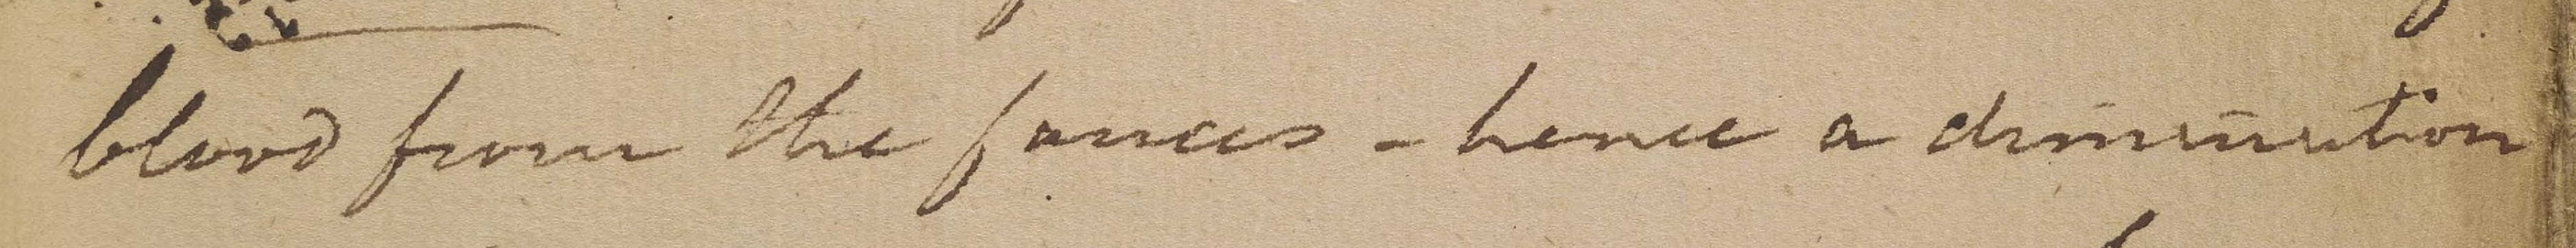blood from the forces, hence a diminuation
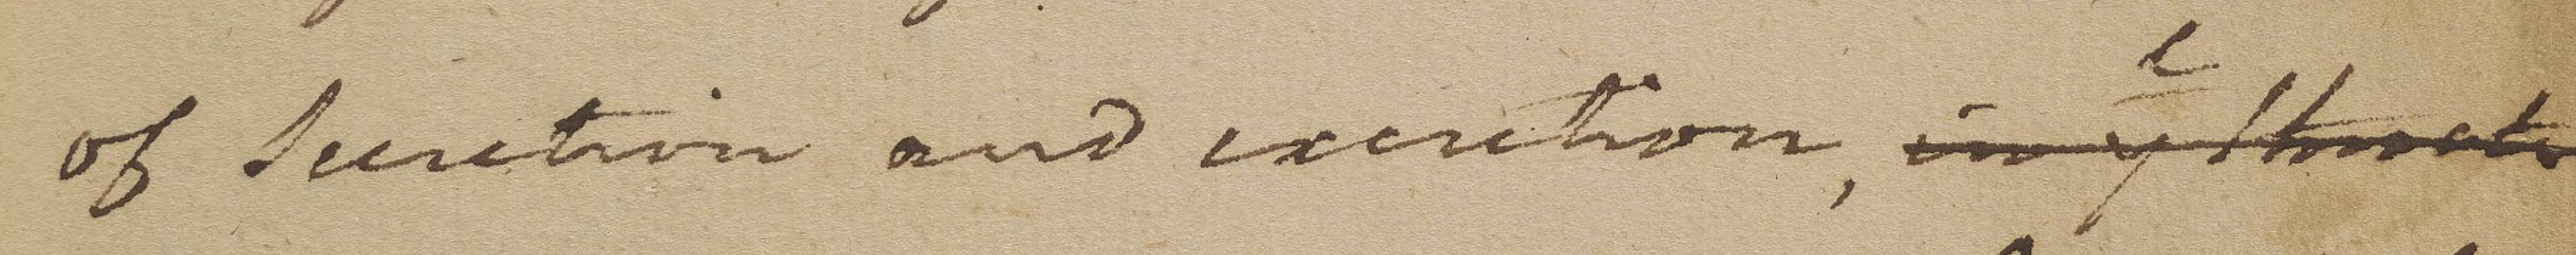of secretion and execution, [in y^e throat]
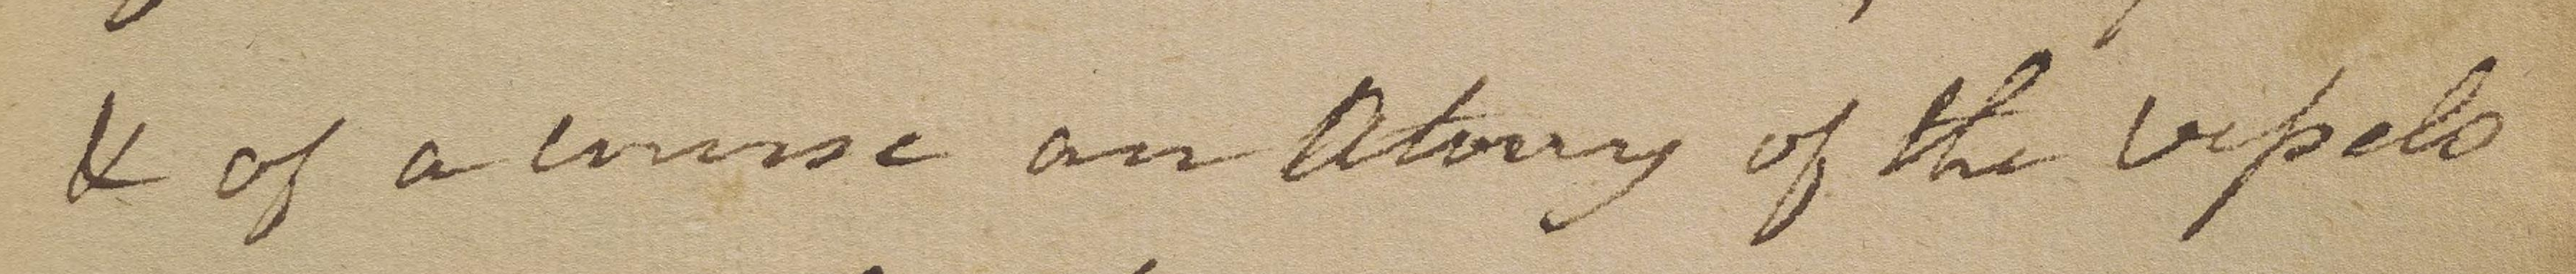& of a course an Artery of the vessels
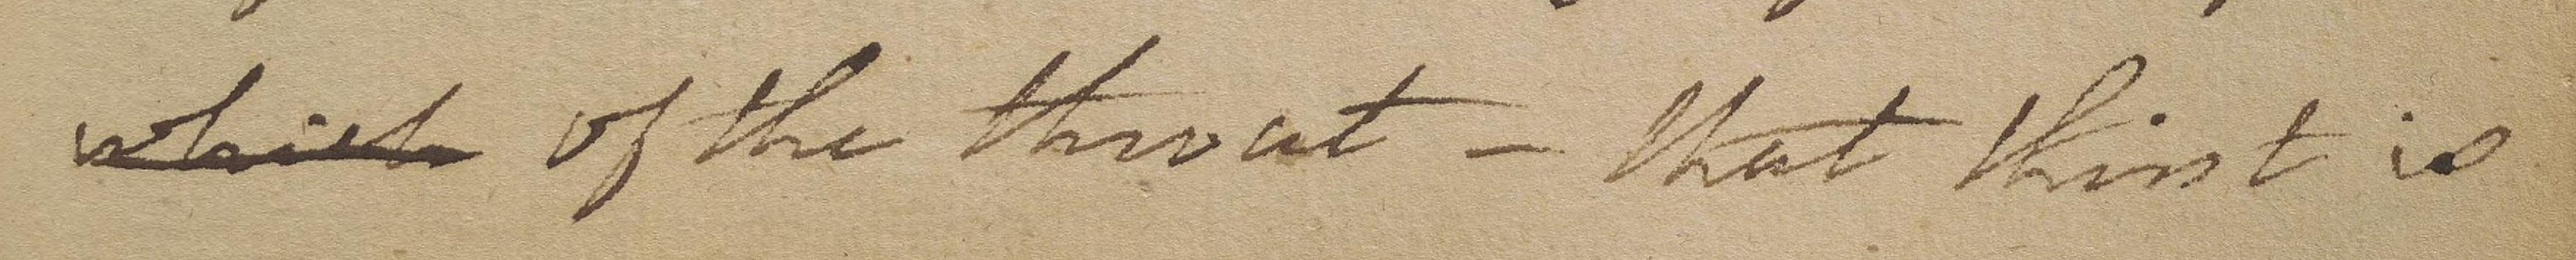[which] of the throat- that thirst is
